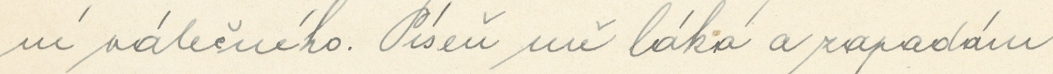ní válečného. Píseň mě láká a zapadám
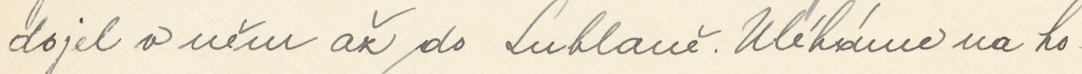dojel v něm až do Lublaně. Uléháme na ho-
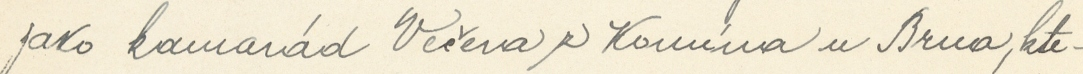jako kamarád Večera z Komína u Brna, kte-
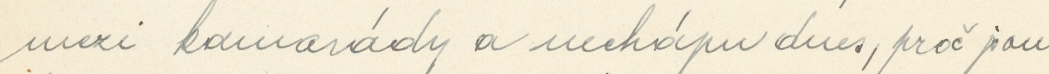mezi kamarády a nechápu dnes, proč jsou
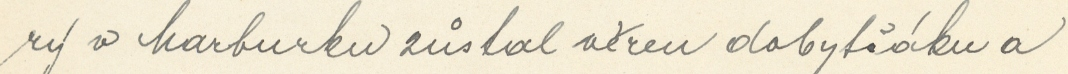rý v Marburku zůstal věren dobytčáku a
